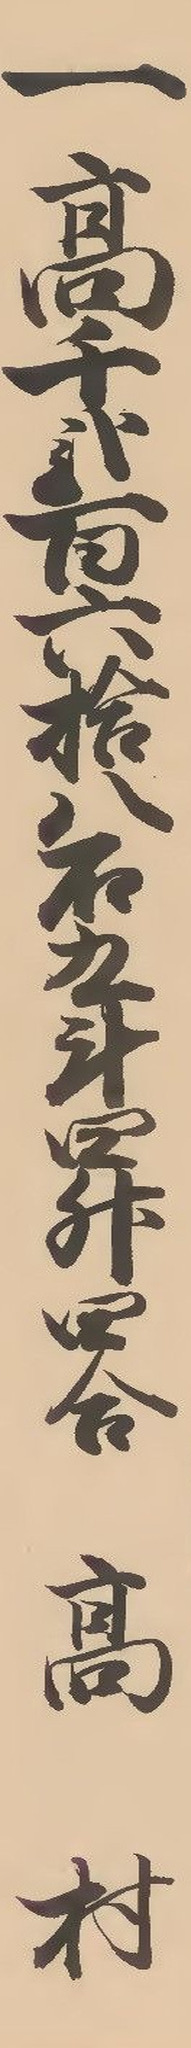一高千弐百六拾八石九斗四升四合高村

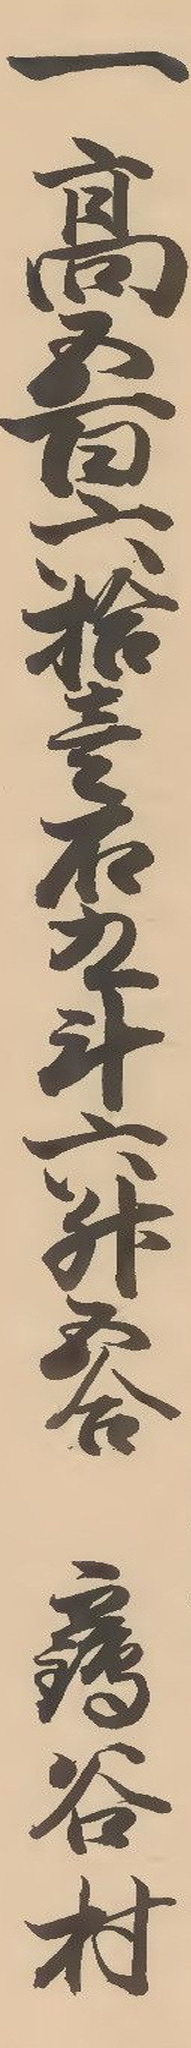一高五百六拾壱石九斗六升五合鶴谷村
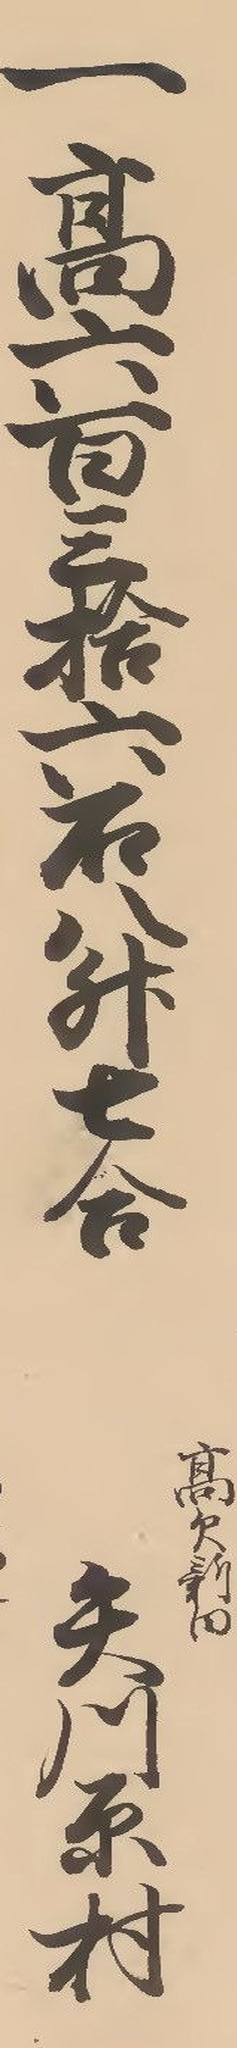一高六百三拾六石八升七合矢川原村
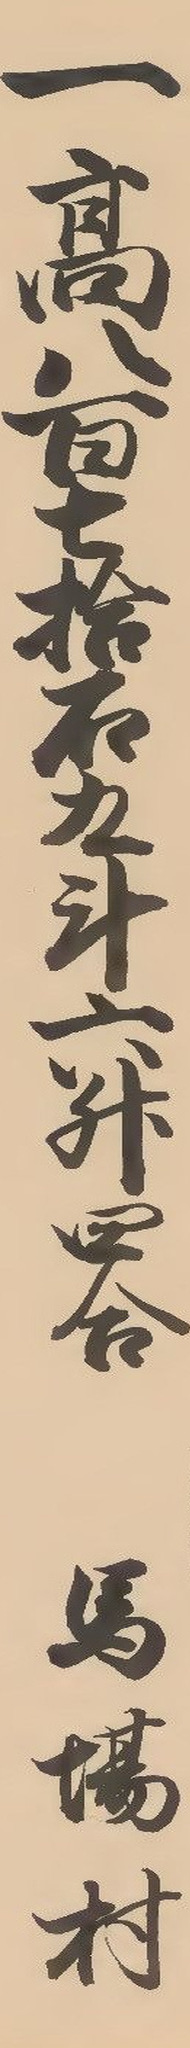一高八百七拾石九斗六升四合馬場村
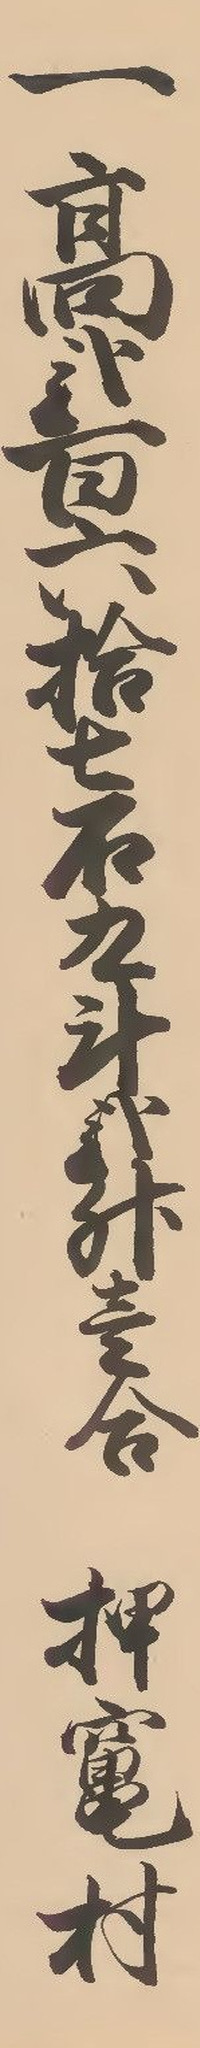一高弐百六拾七石九斗弐升壱合押竃村
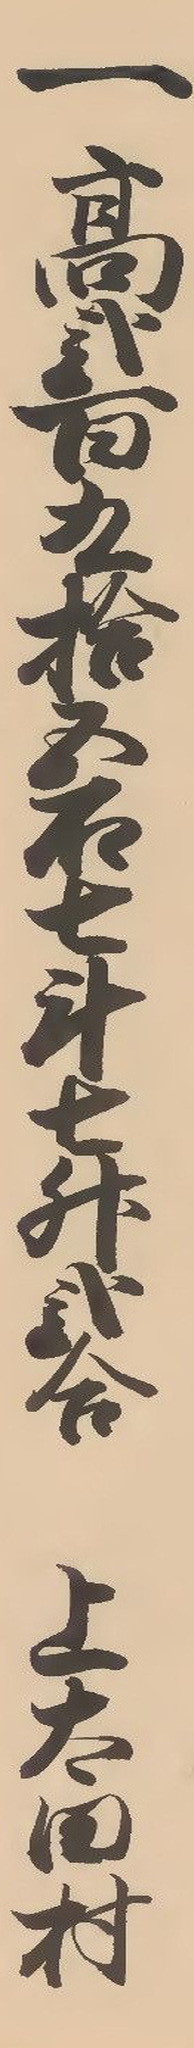一高弐百九拾五石七斗七升弐合上太田村
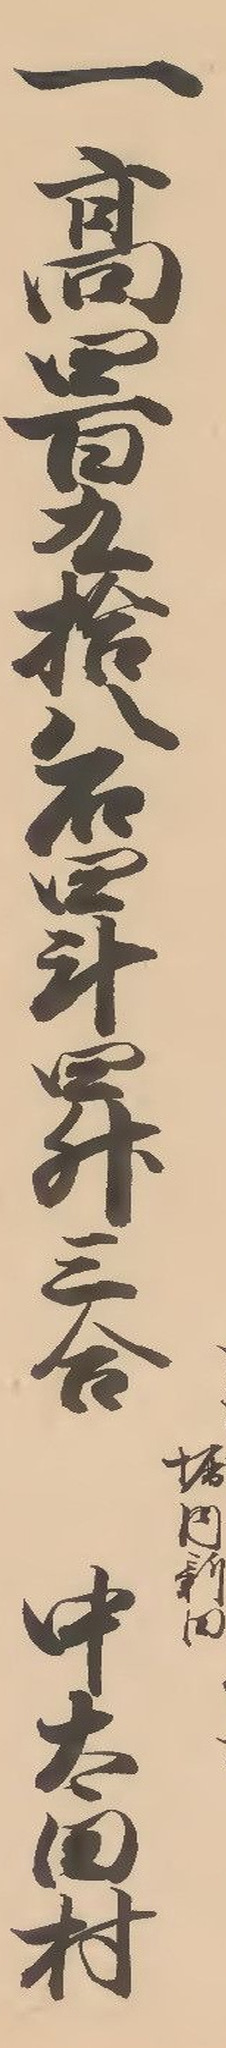一高四百九拾八石四斗四升三合中太田村
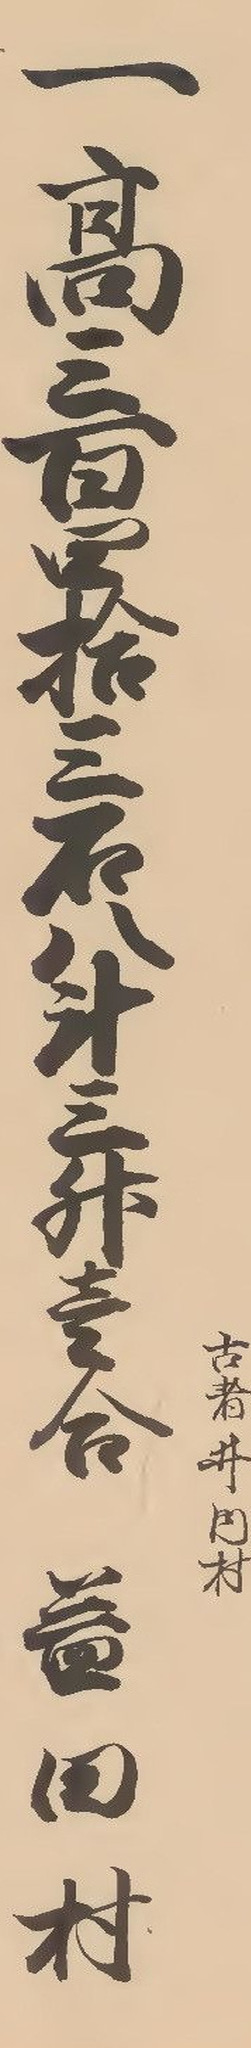一高三百四拾三石八斗三升壱合益田村
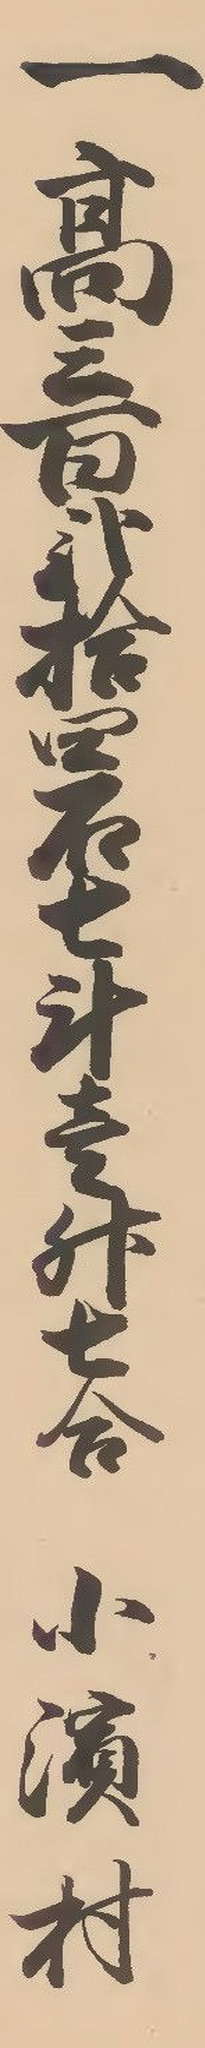一高三百弐拾四石七斗壱升七合小浜村

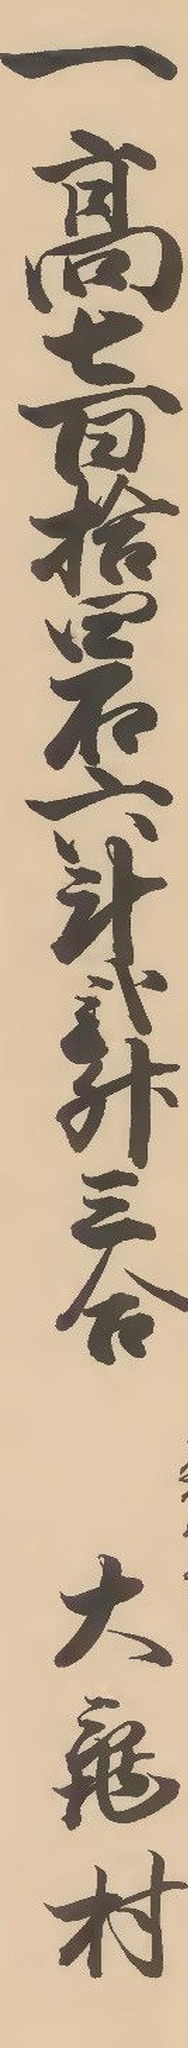一高七百拾四石六斗弐升三合大亀村
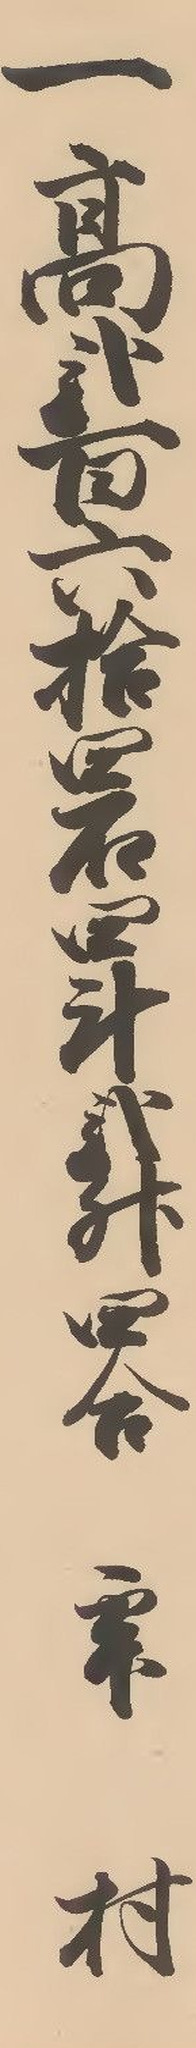一高弐百六拾四石四斗弐升四合雫村
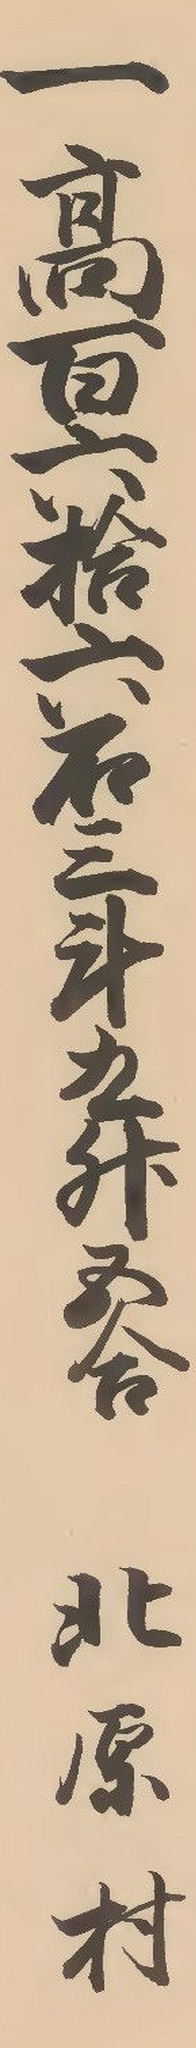一高百六拾六石三斗九升五合北原村
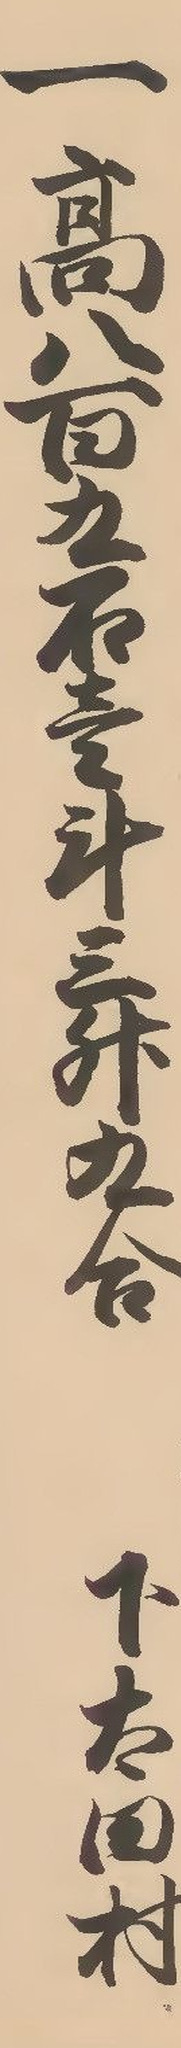一高八百九石壱斗三升九合下太田村
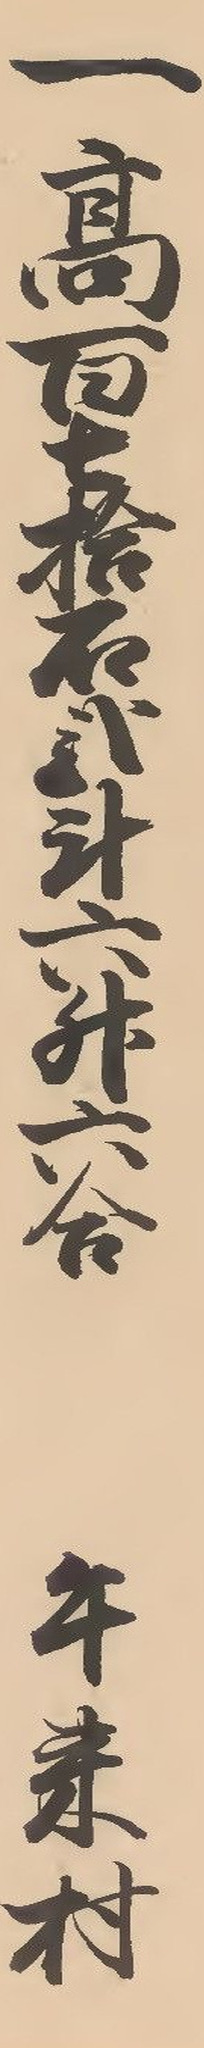一高百七拾石弐斗六升六合牛来村
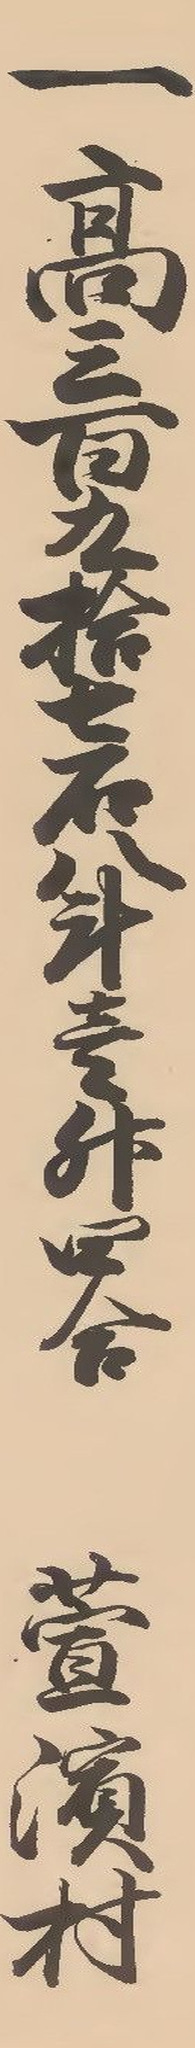一高三百九拾七石八斗壱升四合萱浜村
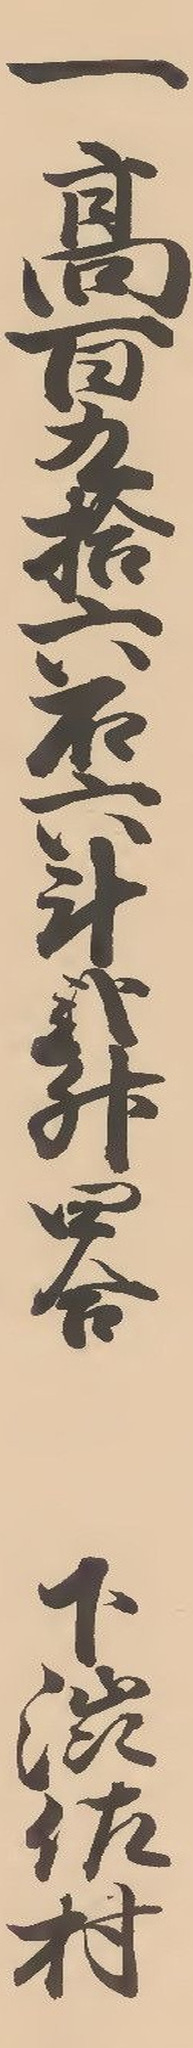一高百九拾六石六斗弐升四合下渋佐村
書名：陸奥国郷帳　３
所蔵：国立公文書館 National Archives of Japan
